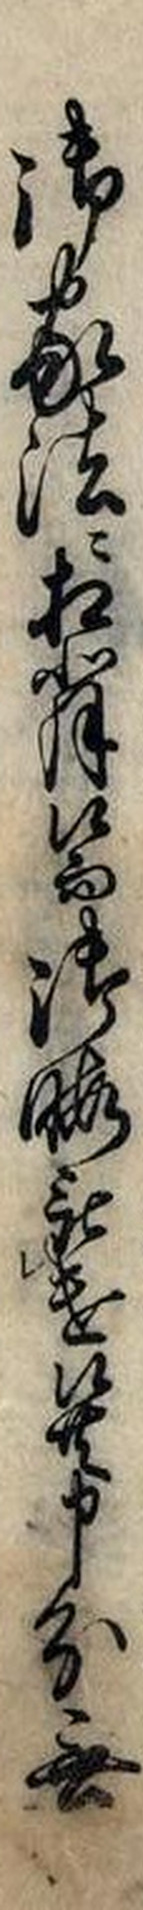御家法に相背候而御暇被遣候共申分無
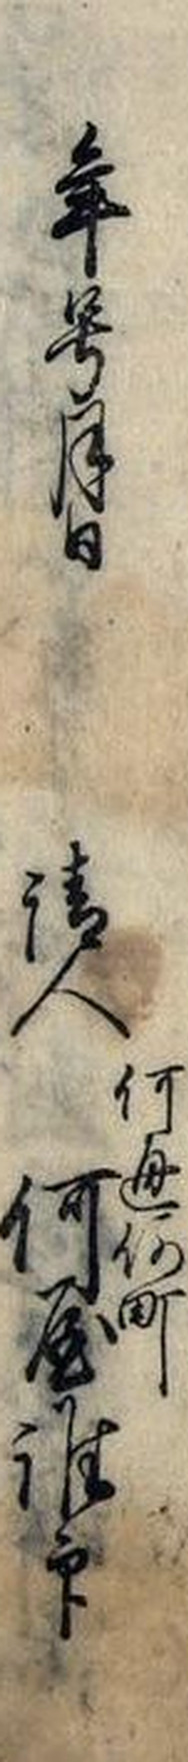年号月日請人何屋誰印

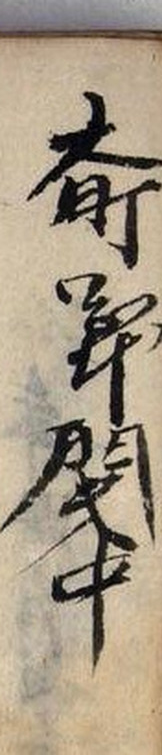大町岡本中
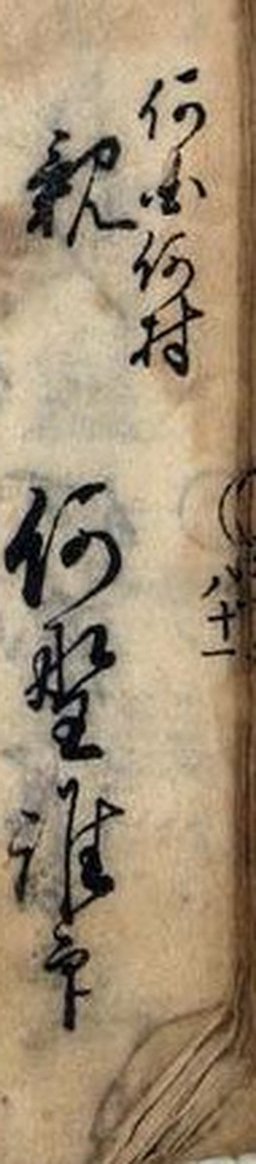親何野誰印
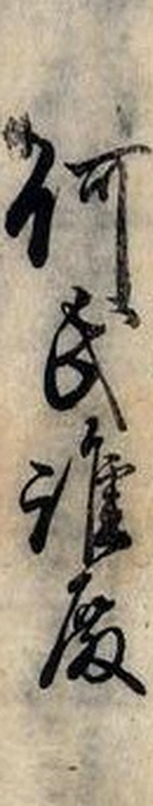何氏誰殿
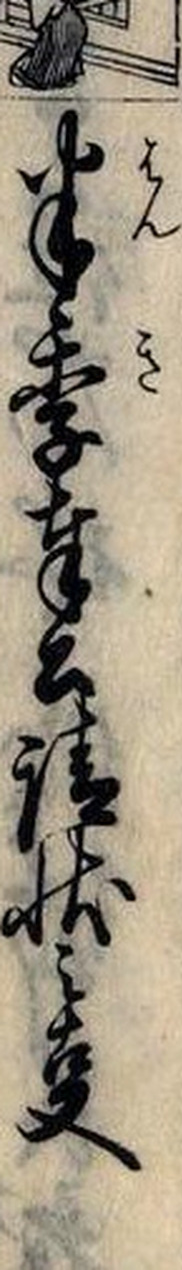半季奉公請状之事
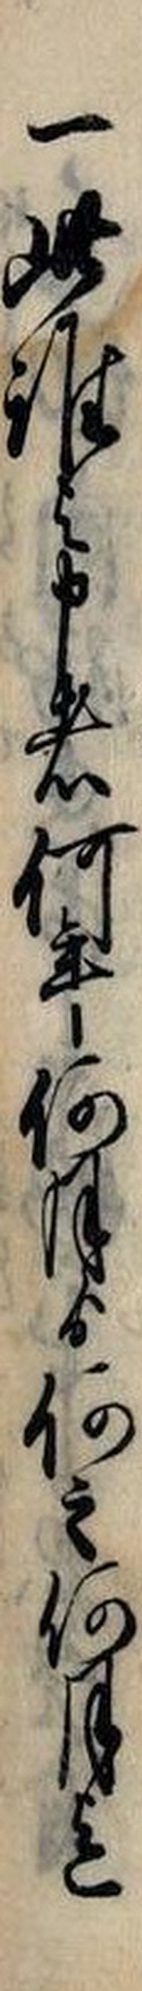一此誰与申者何年何月ゟ何之何月迄
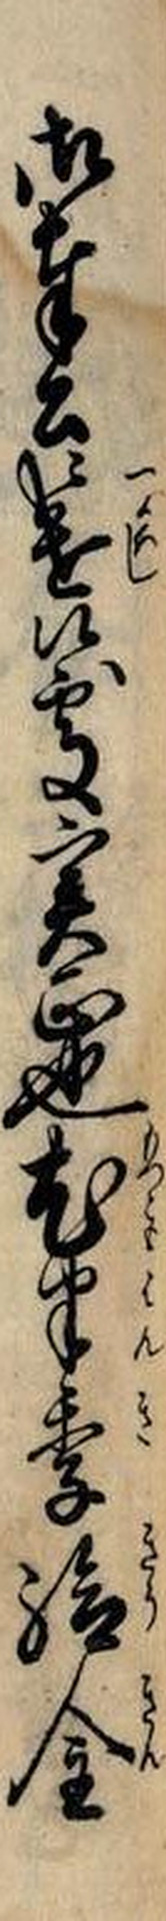御奉公に遣候處実正也尤半季給金
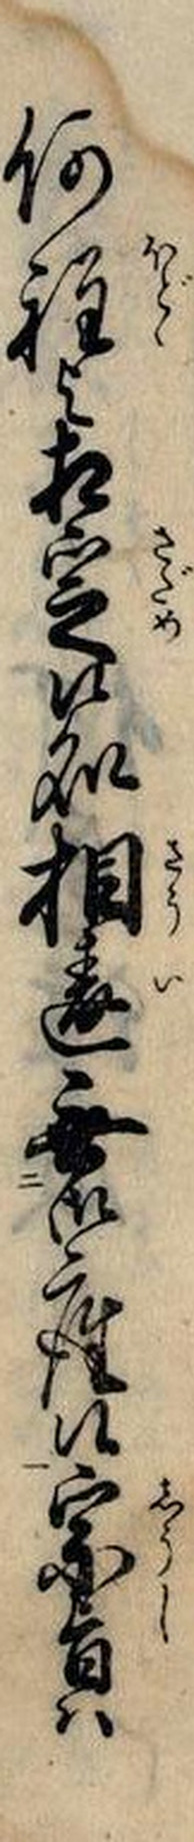何程与相定候処相違無御座候宗旨は
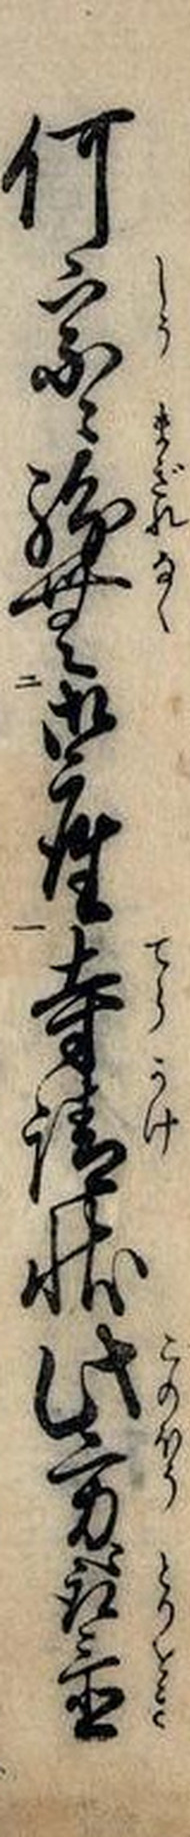何宗に紛無御座寺請状此方に取置
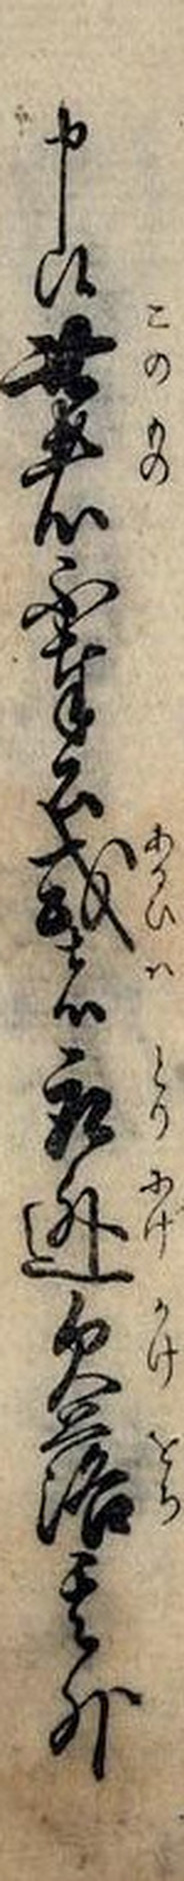申候此者不奉公或者取逃欠落其外
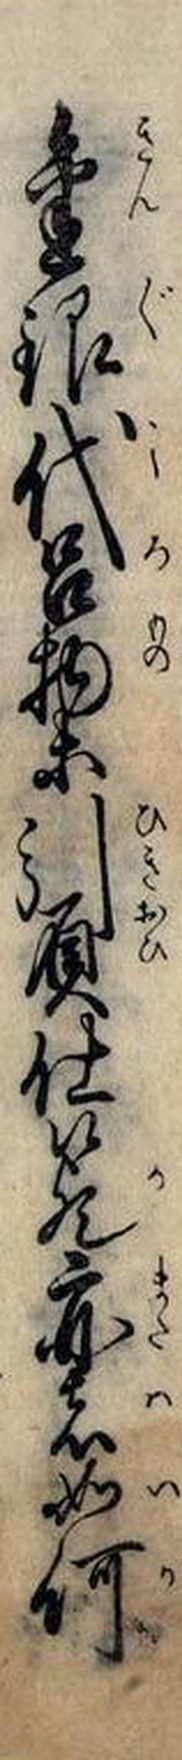金銀代呂物等引負仕候歟亦者如何

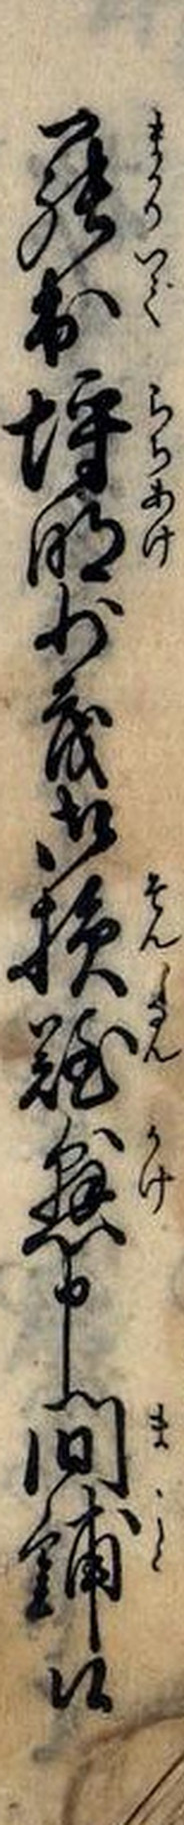罷出埒明少も御損難懸申間舖候
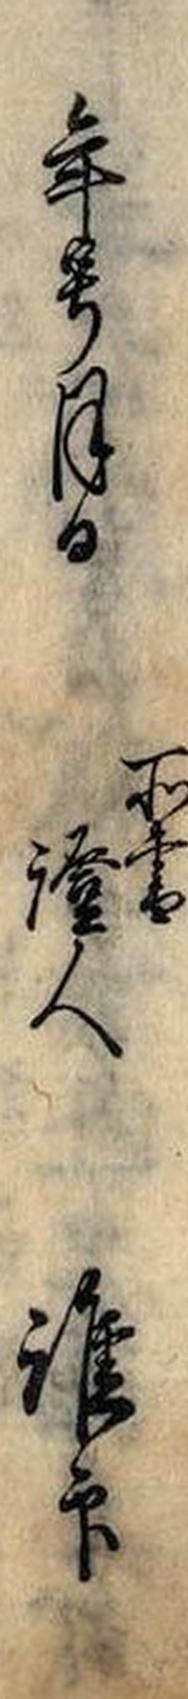年号月日證人誰印
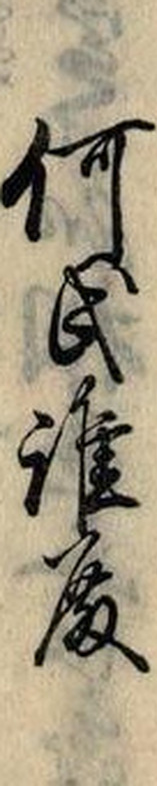何氏誰殿
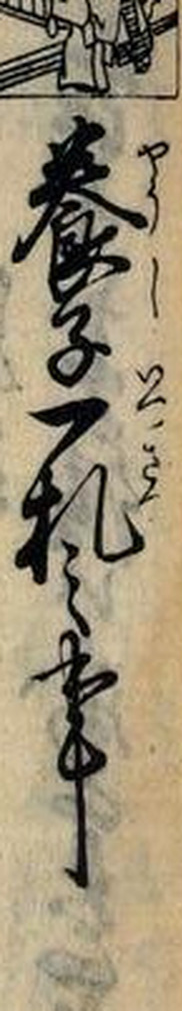養子一札之事
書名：大成用文章（往来物）
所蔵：福井県文書館 Fukui Prefectural Archives
